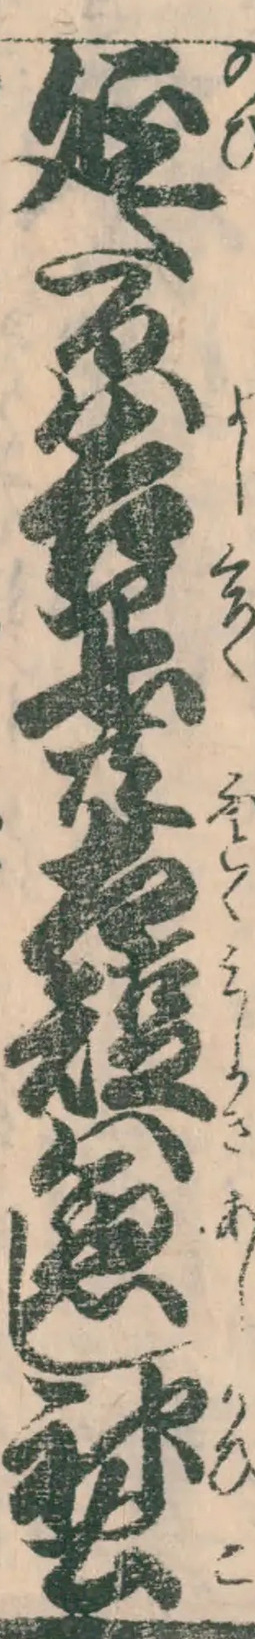延たるは吉黒共太短は悪し蚕
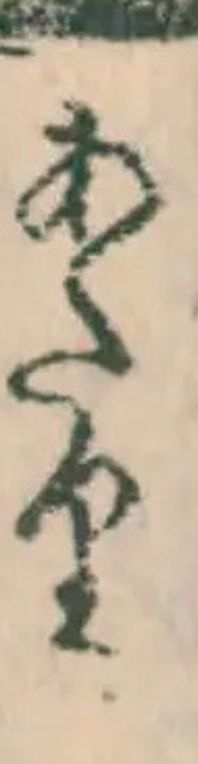あたり
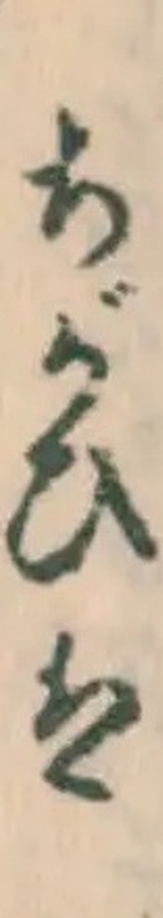ちがひは
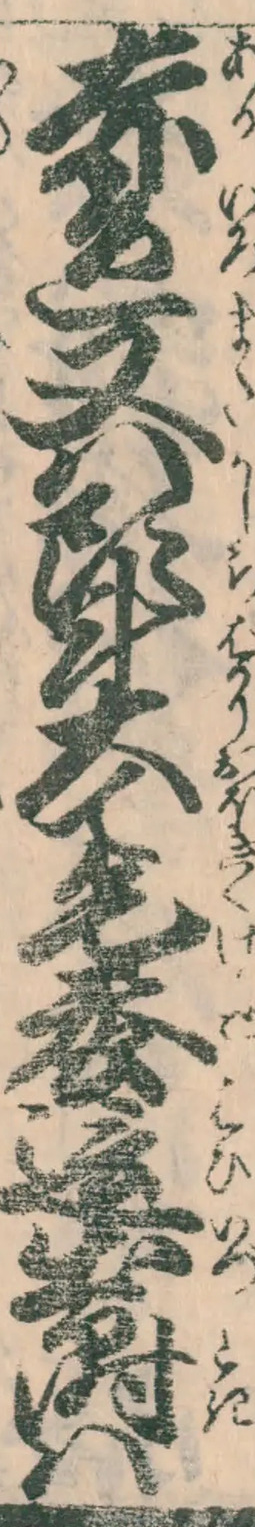赤色又は頭斗大て毛蚕這出る時は
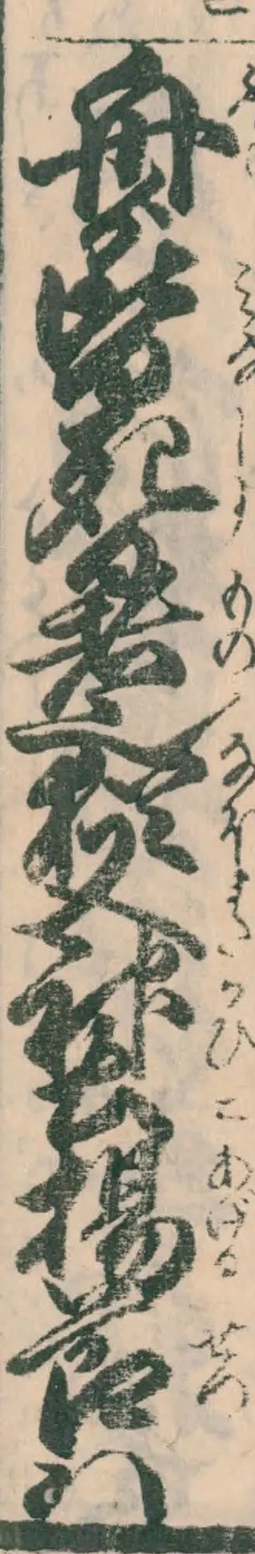舟皆死る者也猶又蚕揚節は
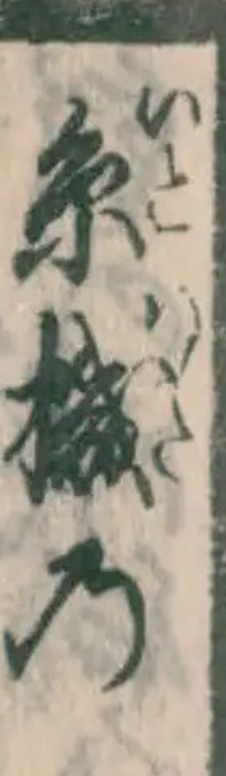糸機の
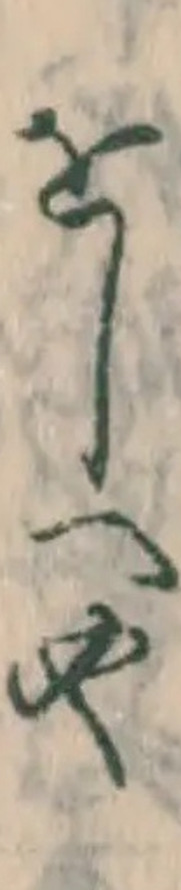をしへや
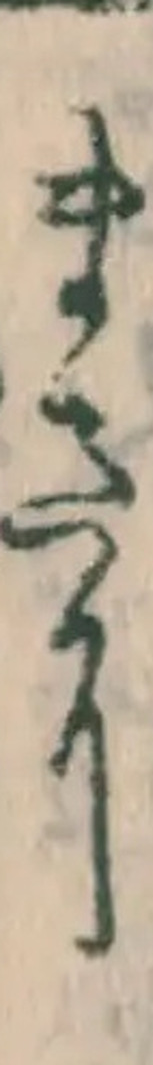まさに
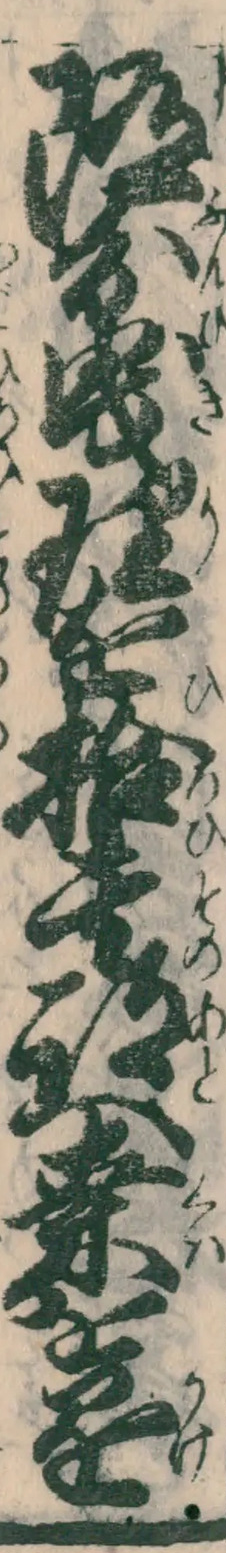随分曳理を拾其跡へ桑を懸
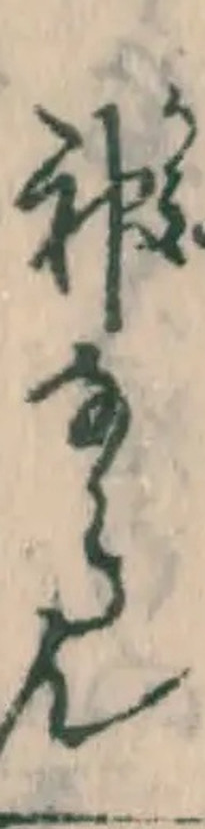神ならん
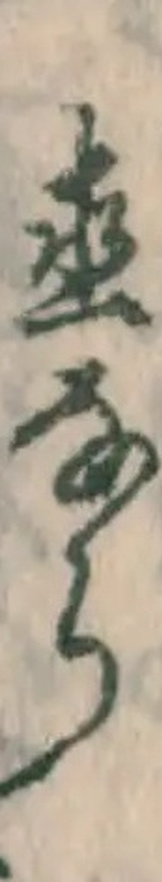直なら
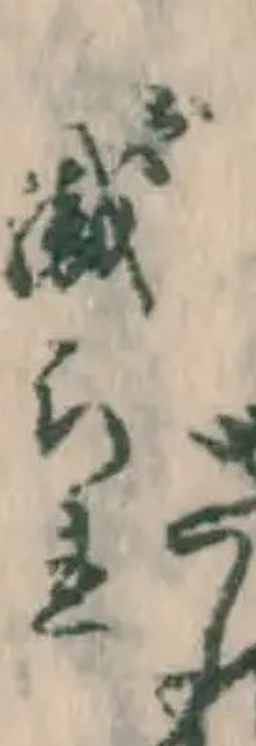織られ
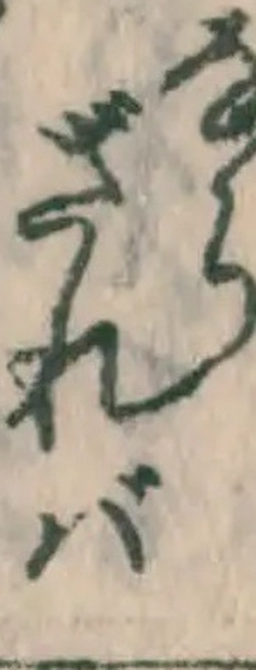ざれば
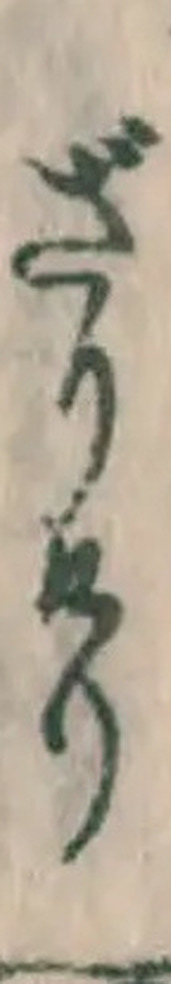ざりけり
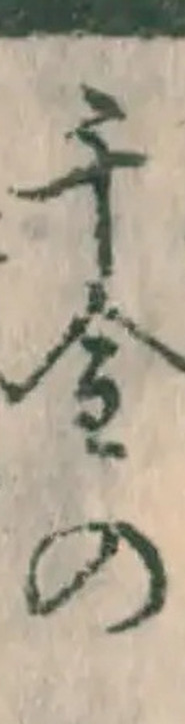千金の
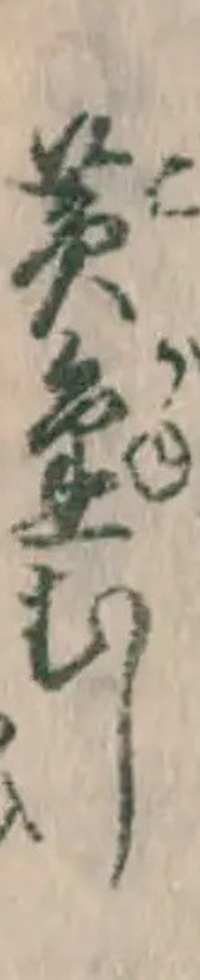黄金むし
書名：養蚕往来
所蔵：国立国会図書館 National Diet Library, JAPAN
